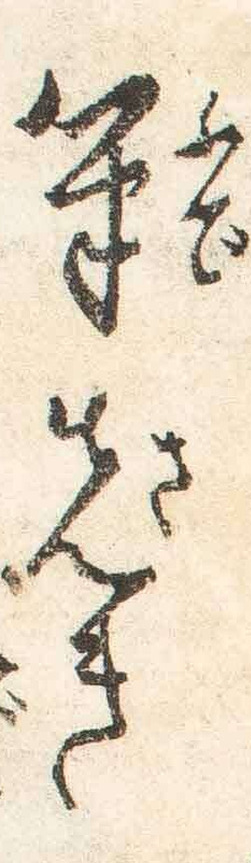筆先き
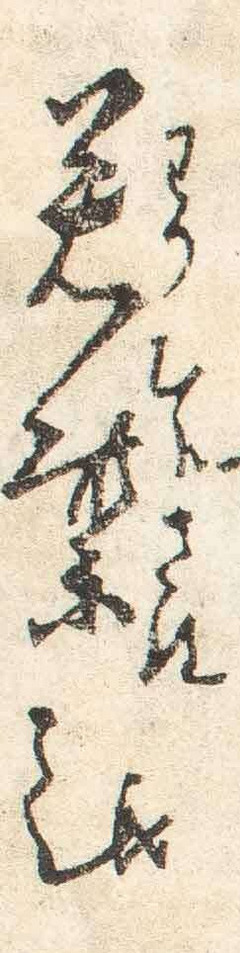若紫を
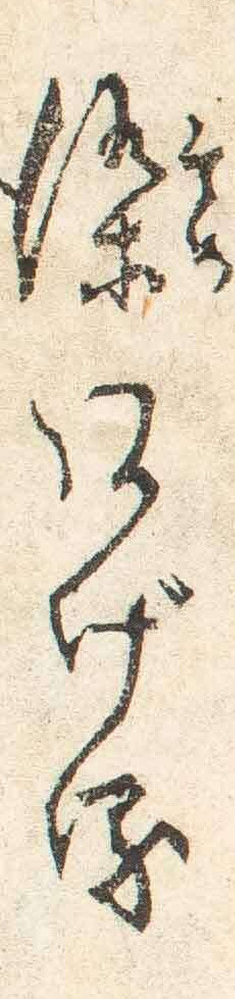染さげる

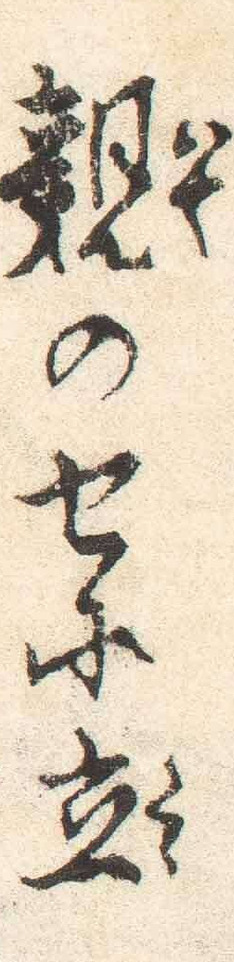親のせに立
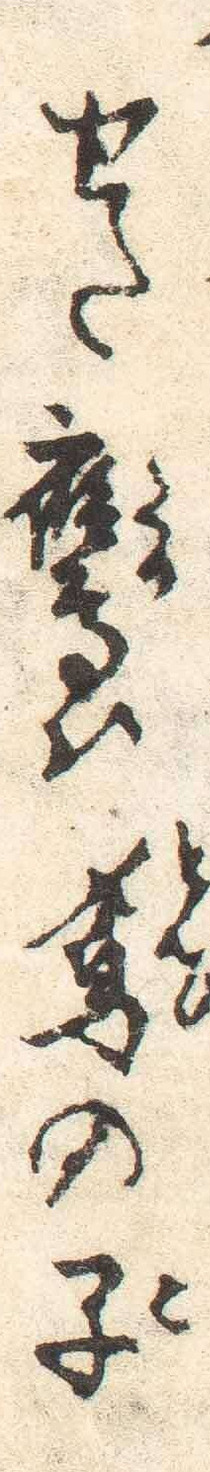せた鷹は鳶の子
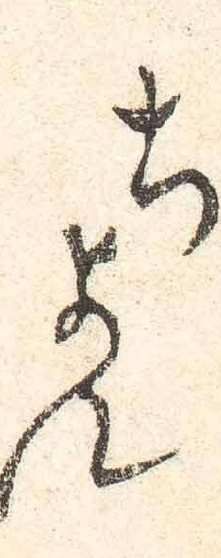ちよん
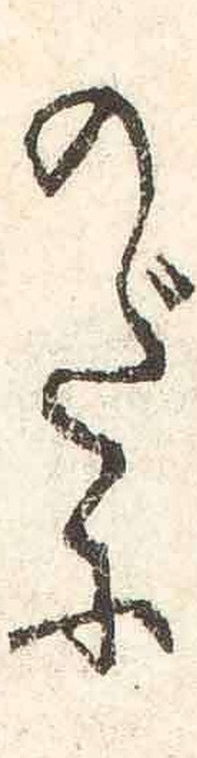のだに
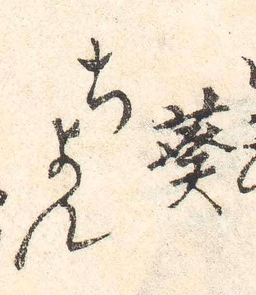ちよん
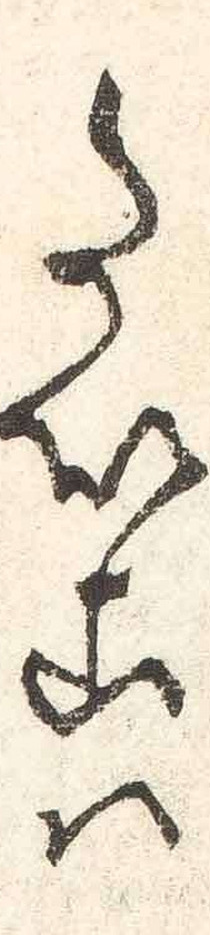たいこは
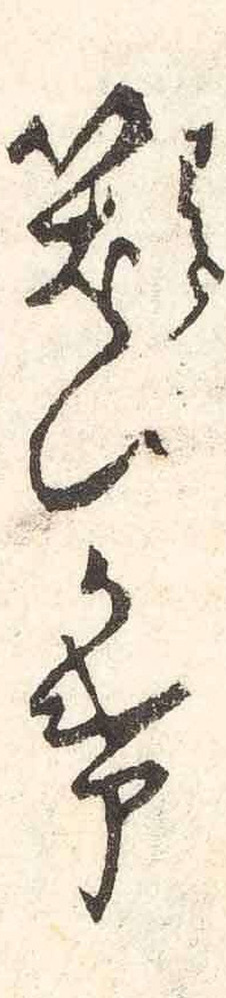笑ひかけ
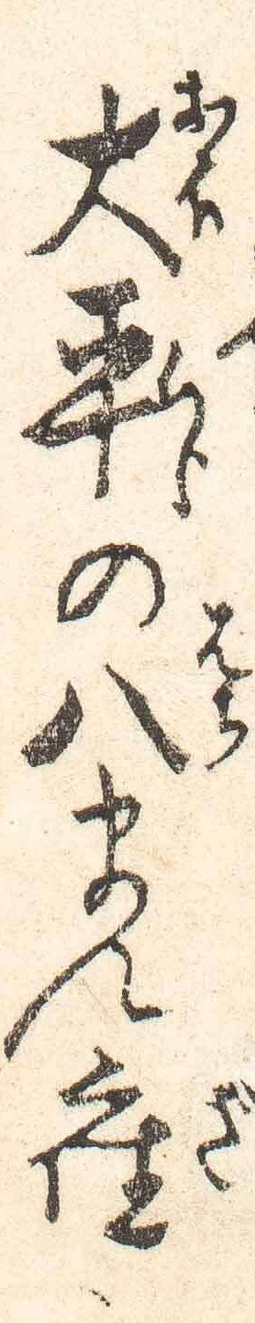大平の八まん座
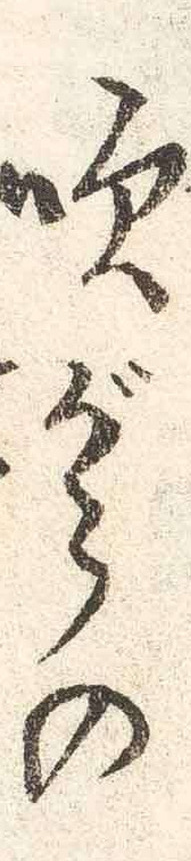吹がらの
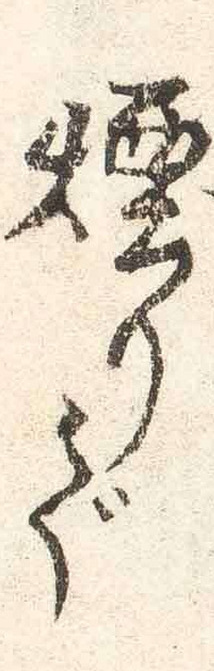煙りで
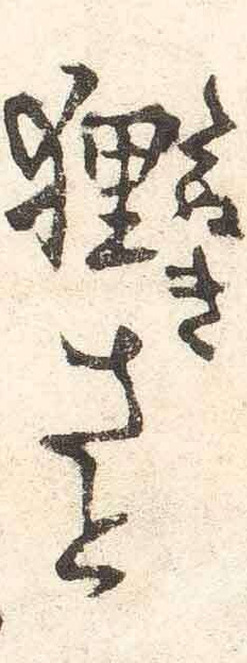狸さと
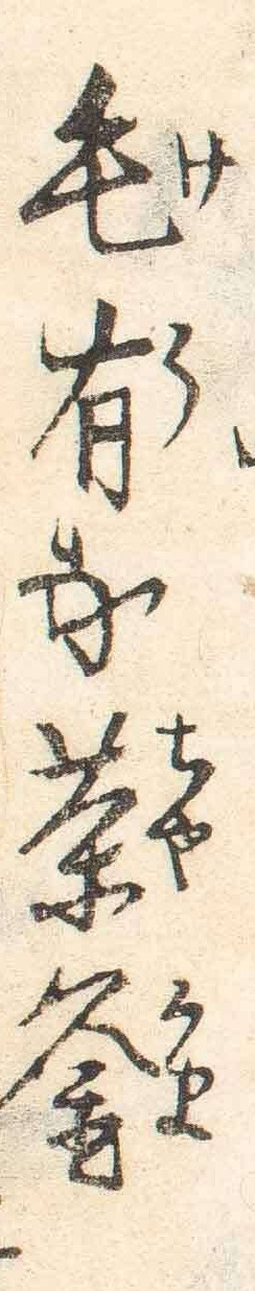毛有な茶釜
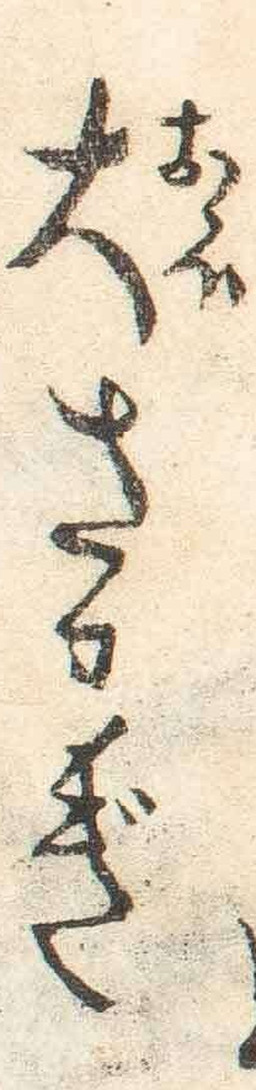大さわぎ
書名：画本柳樽
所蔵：東京学芸大学附属図書館 国文学研究資料館
